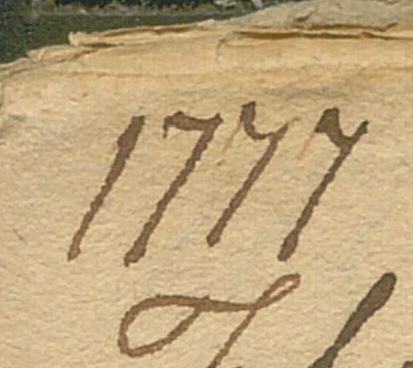1777
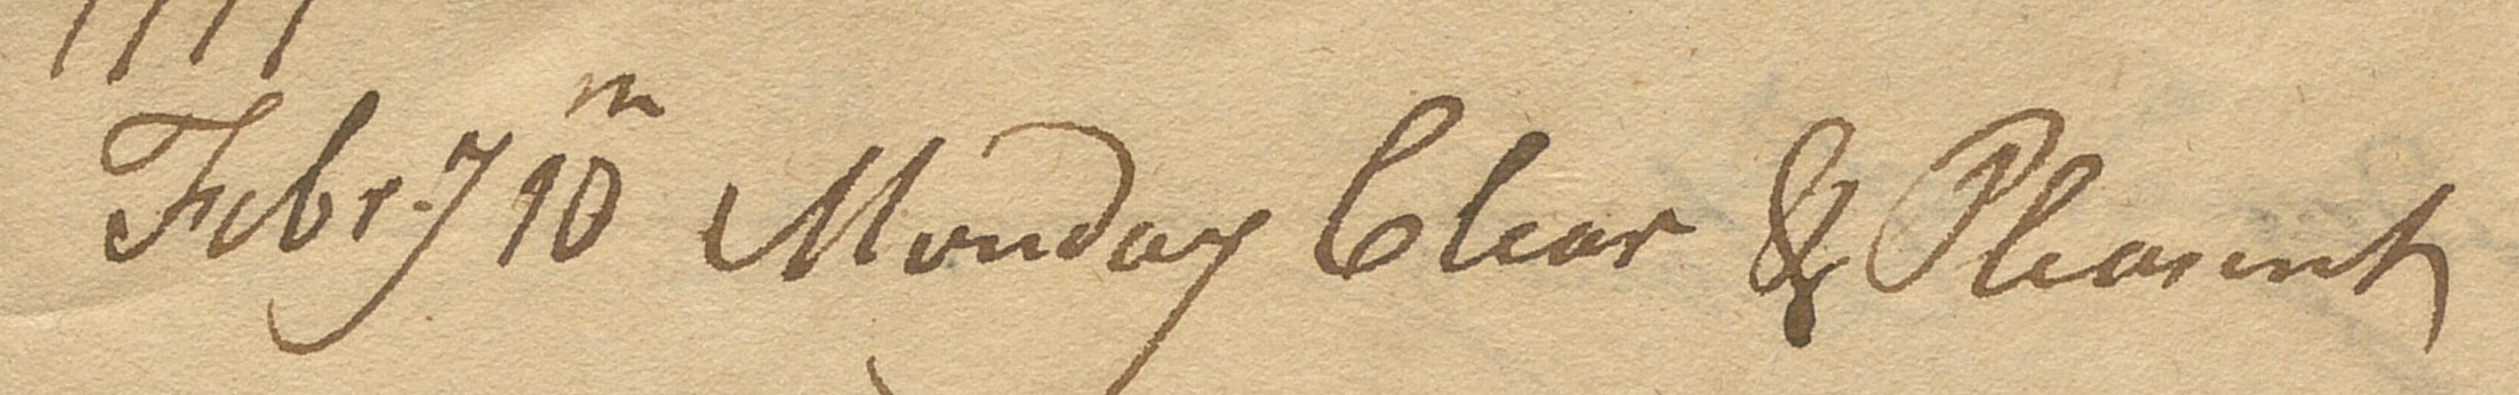Febr^y. 10^th Monday Clear & Pleasent
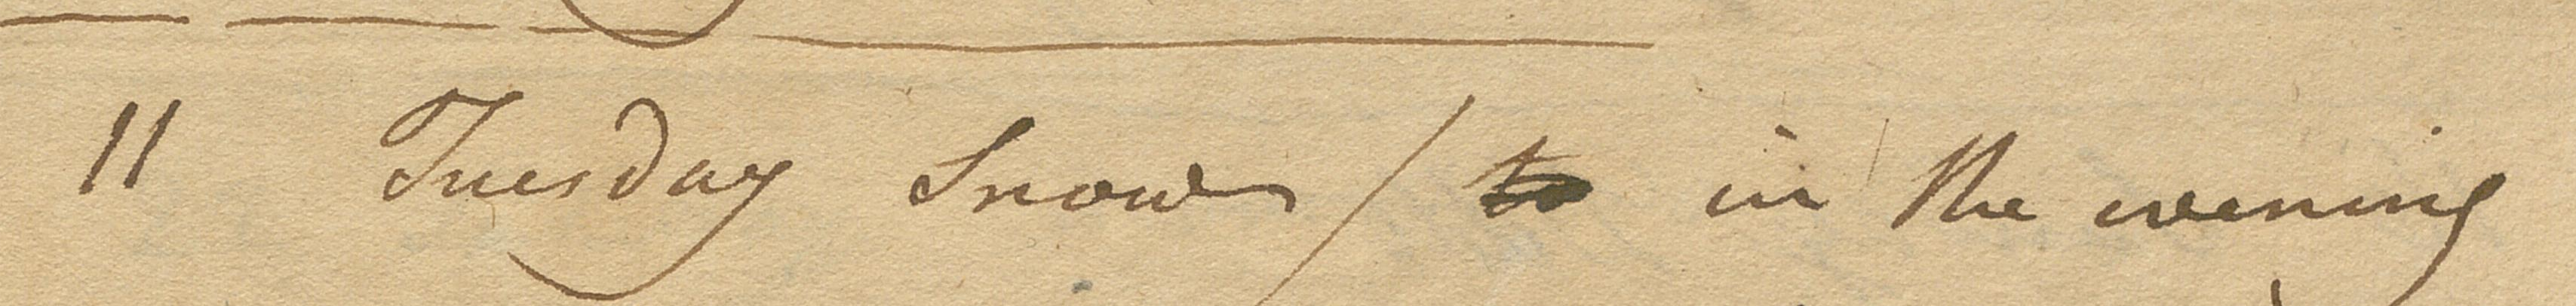11 Tuesday Snow / [to] in the evening
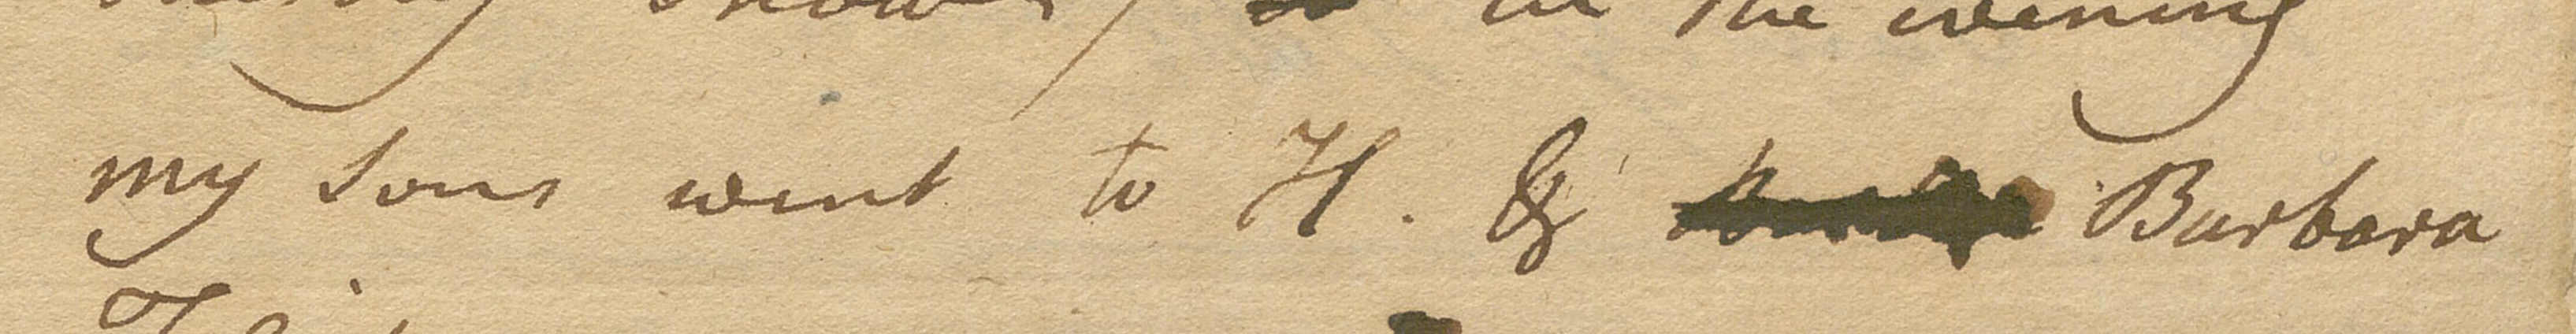my sons went to H. & [_____] Barbara
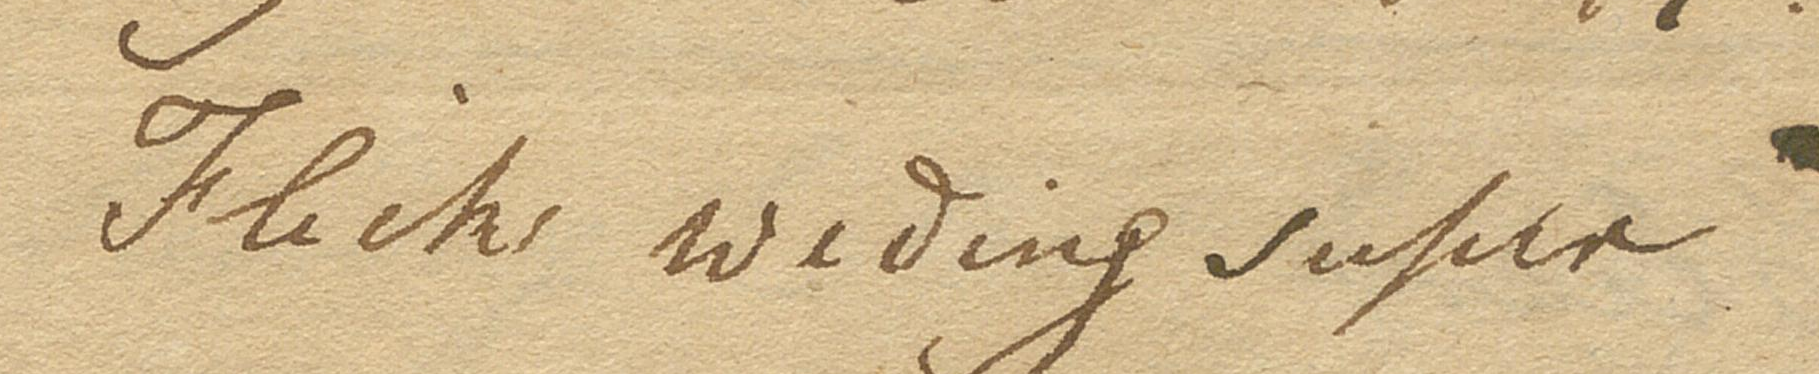Flicks weding super
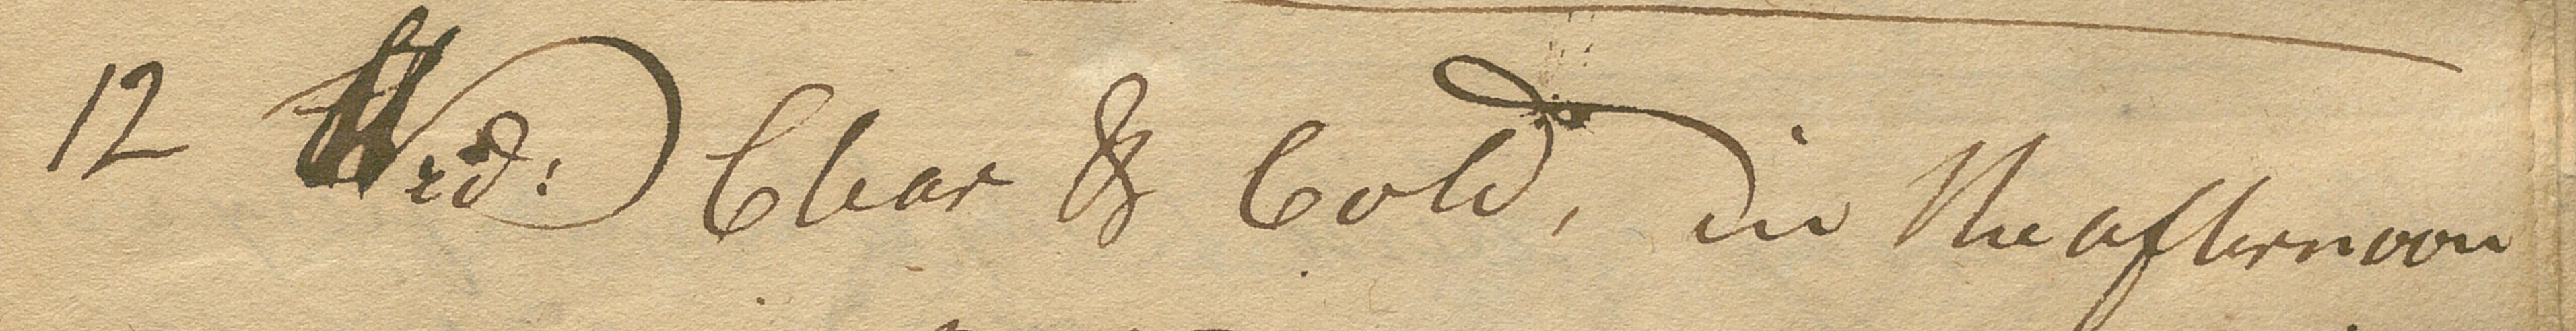12 Wed. Clear & Cold, in the afternoon
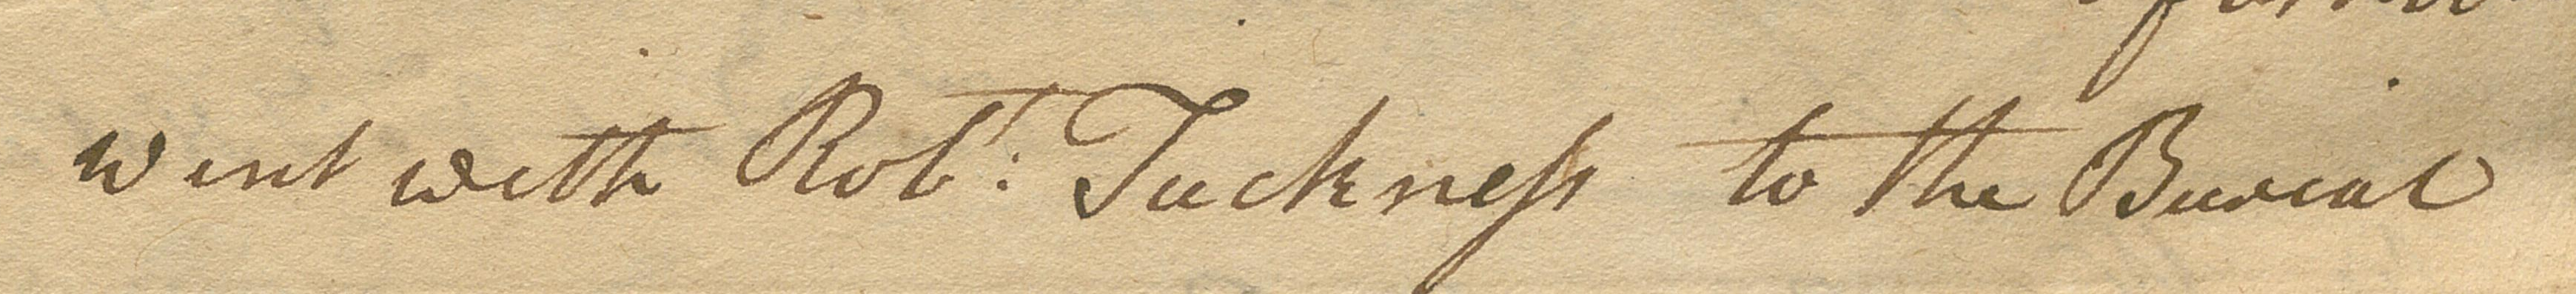went with Rob^t: Tuckness to the Burial
